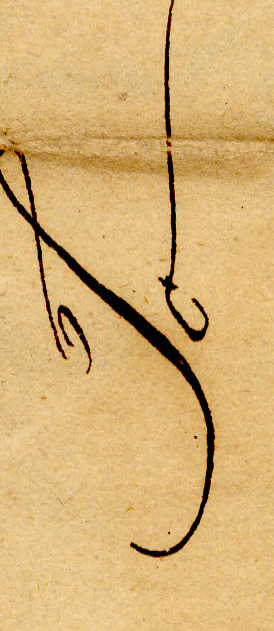To
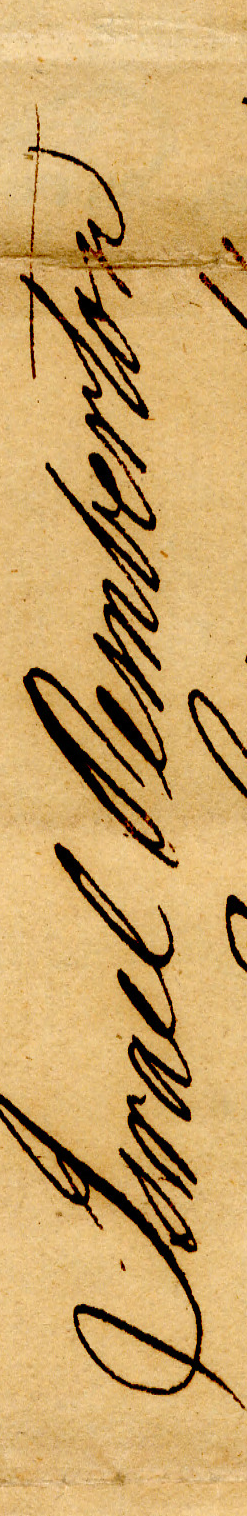Israel Pemberton
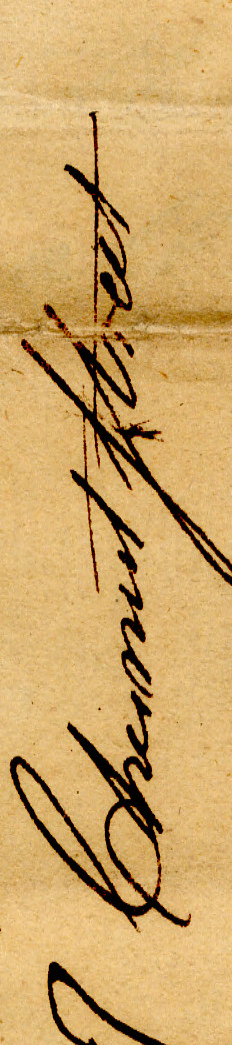Chestnut Street
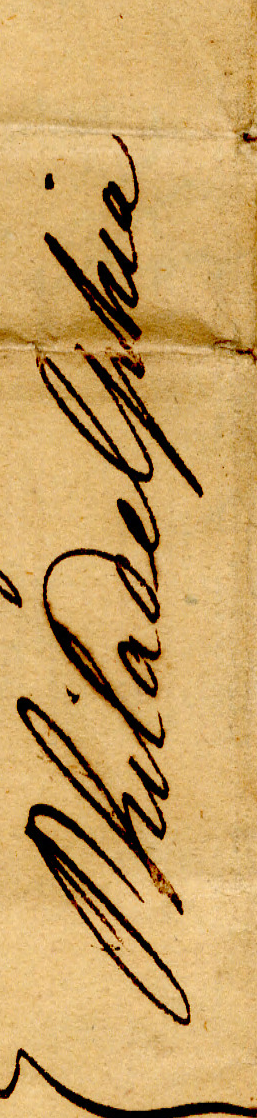Philadelphia
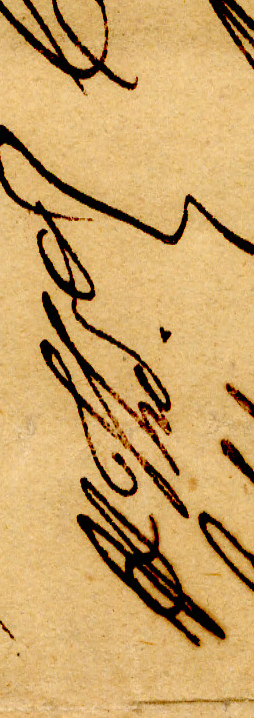per Tho^s.
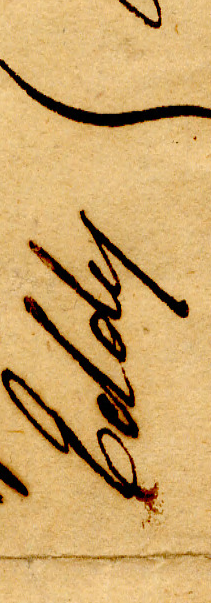Eddy
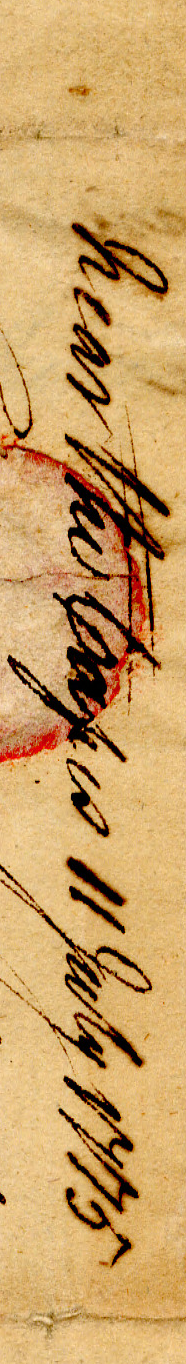near the Capes 11 July 1775
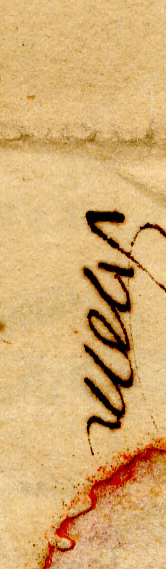From
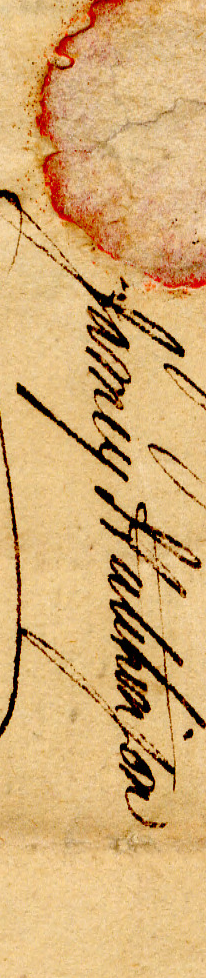Jamey Hutchinson
